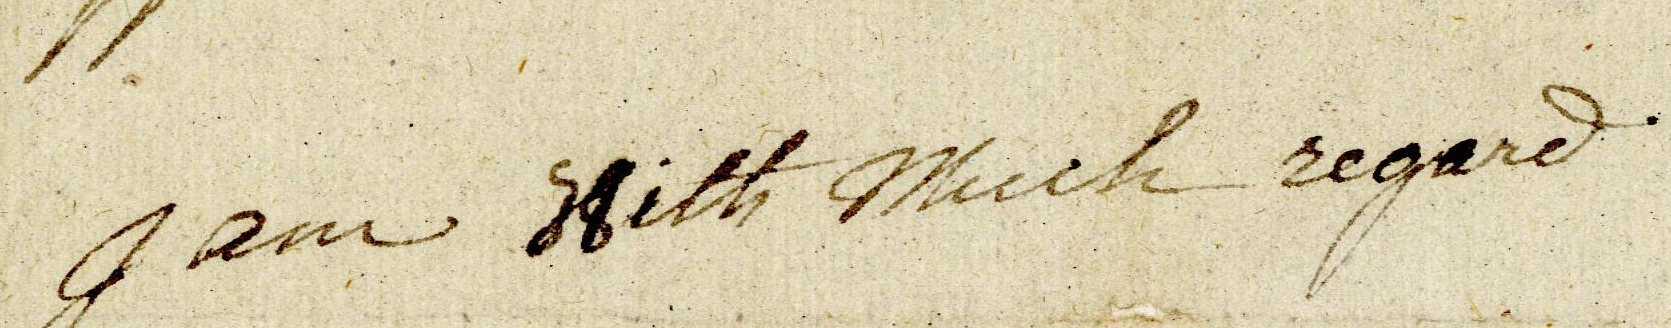I am with Much regard
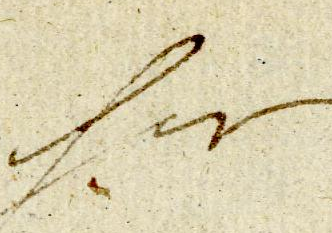Sir
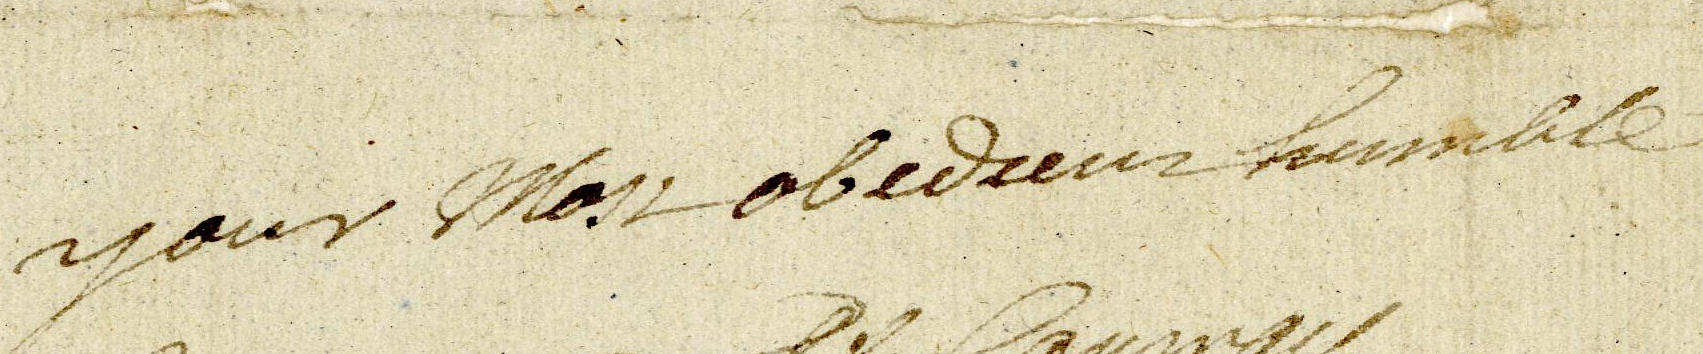your Most obedient humble
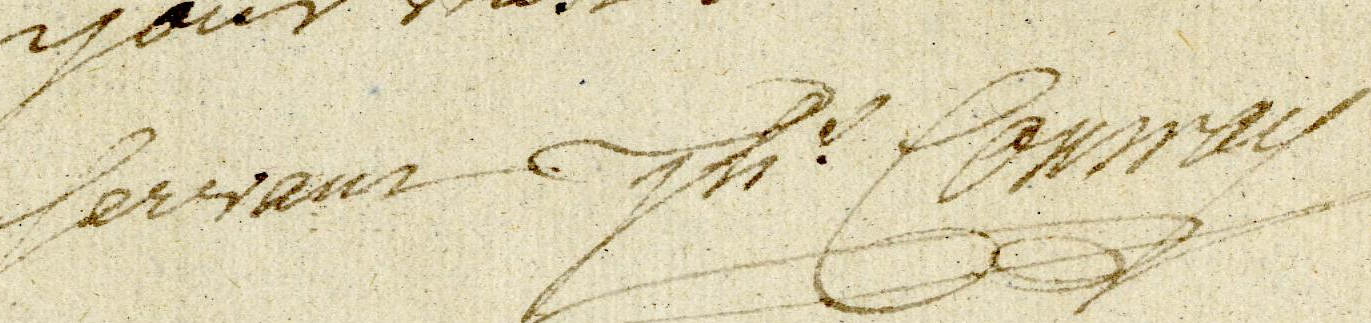Servant Th^s. Conway
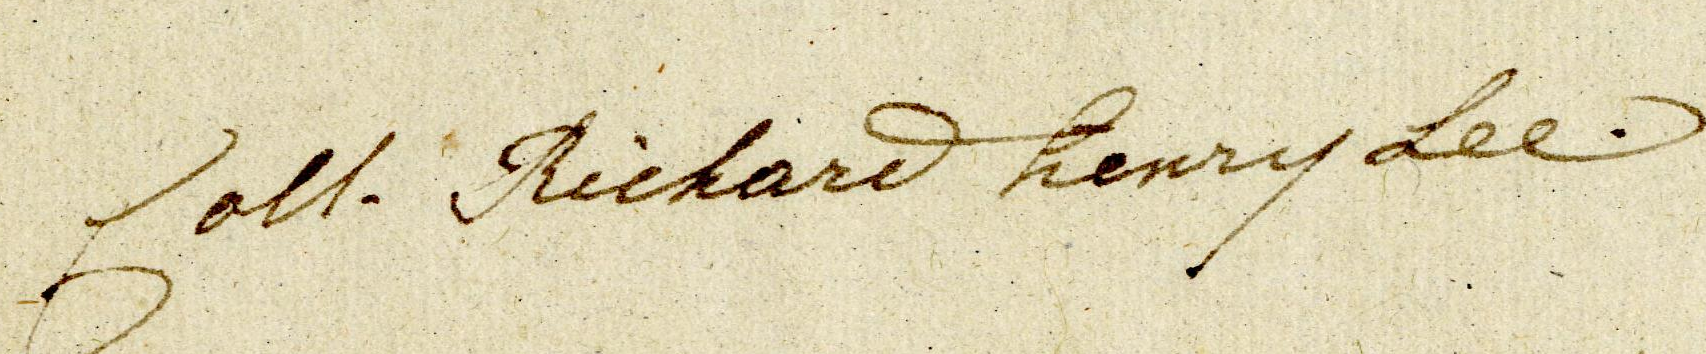Coll. Richard henry Lee
